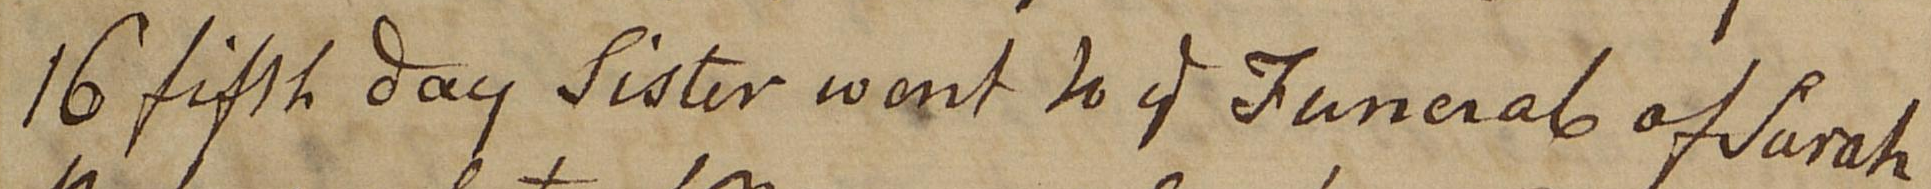16 fifth day Sister went to y^e Funeral of Sarah
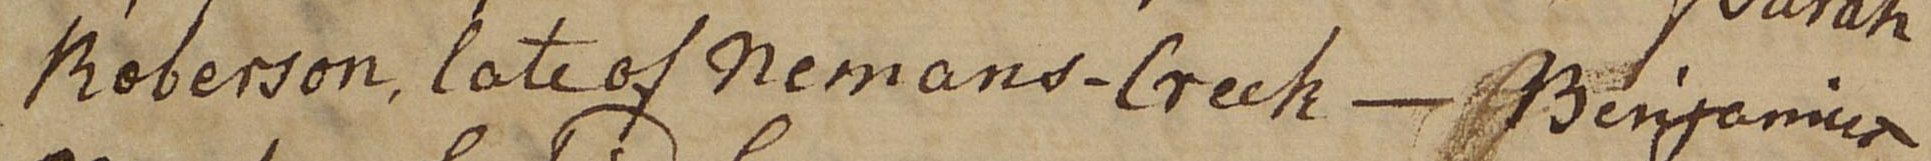Roberson, late of Nemans-Creek- Benjamin
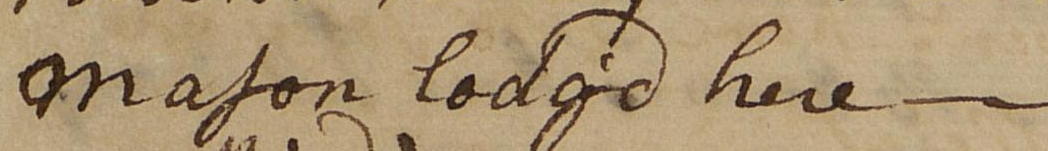Mason lodg'd here-
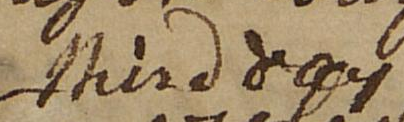third day
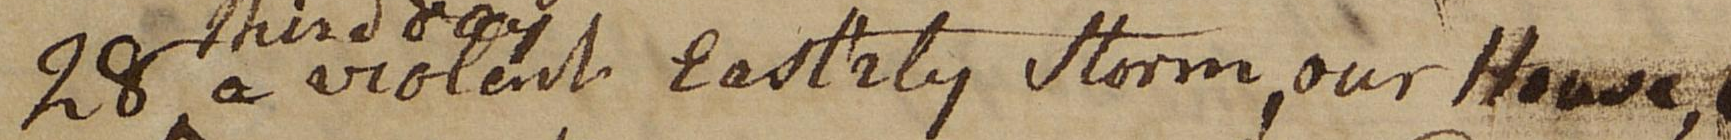28 ^ a violent Eastrly Storm, our House, as
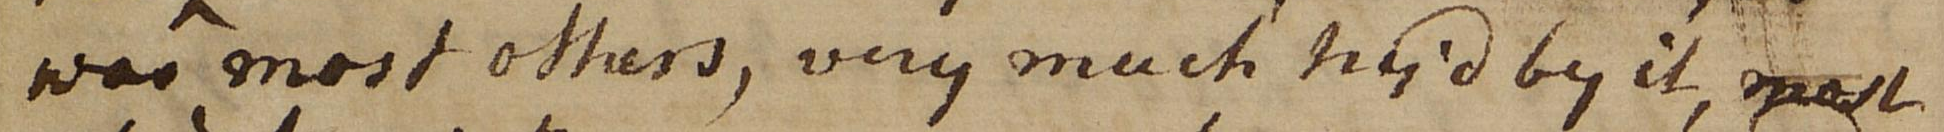was most others, very much try'd by it, mast
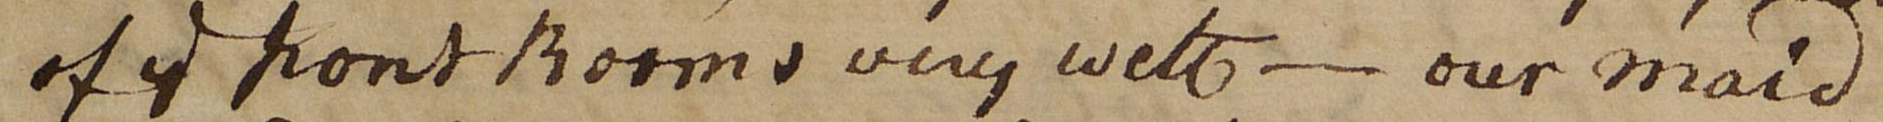of y^e front Rooms very wett- our maid
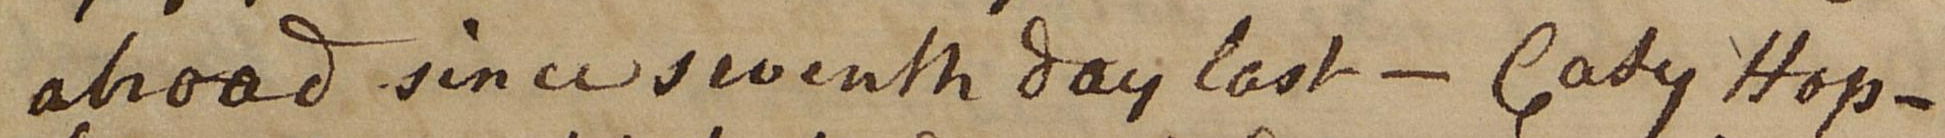abroad since seventh day last- Caty Hop-
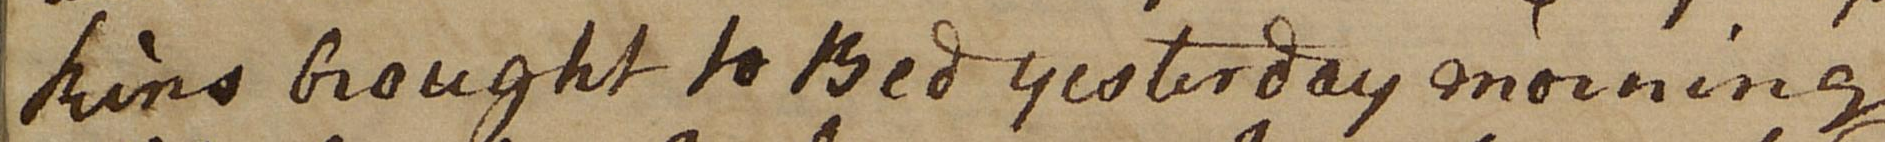kins brought to Bed yesterday morning-
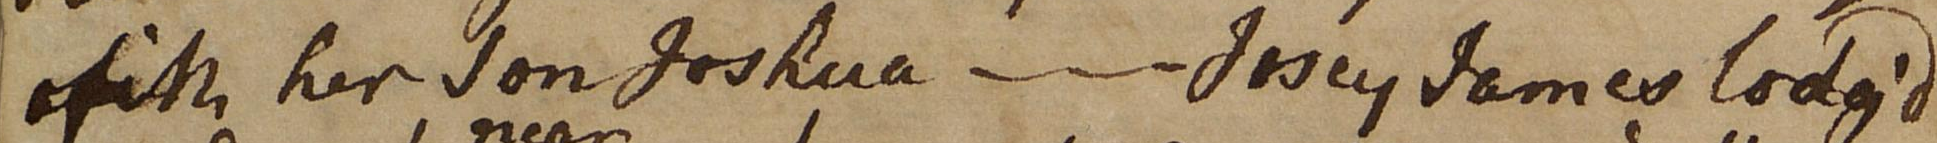[afith] her Son Joshua- Josey James lodg'd
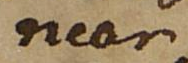near
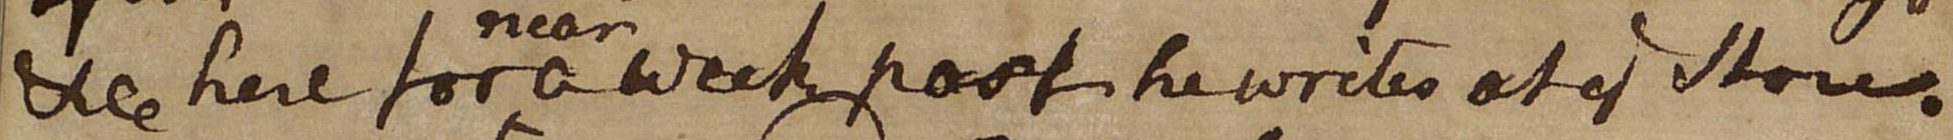&c here for ^ a week part he writes at y^e store.
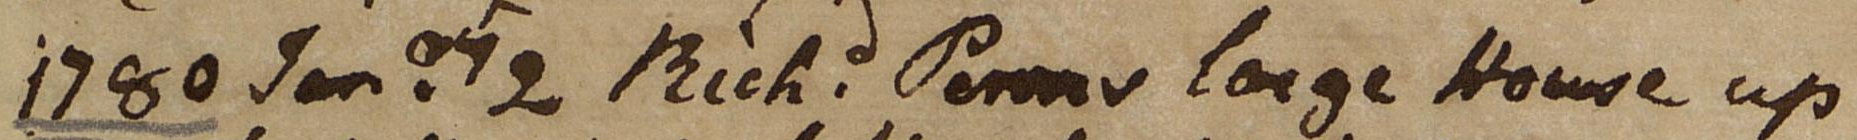780 Jan^ry. 2 Rich^d. Perms large House up
